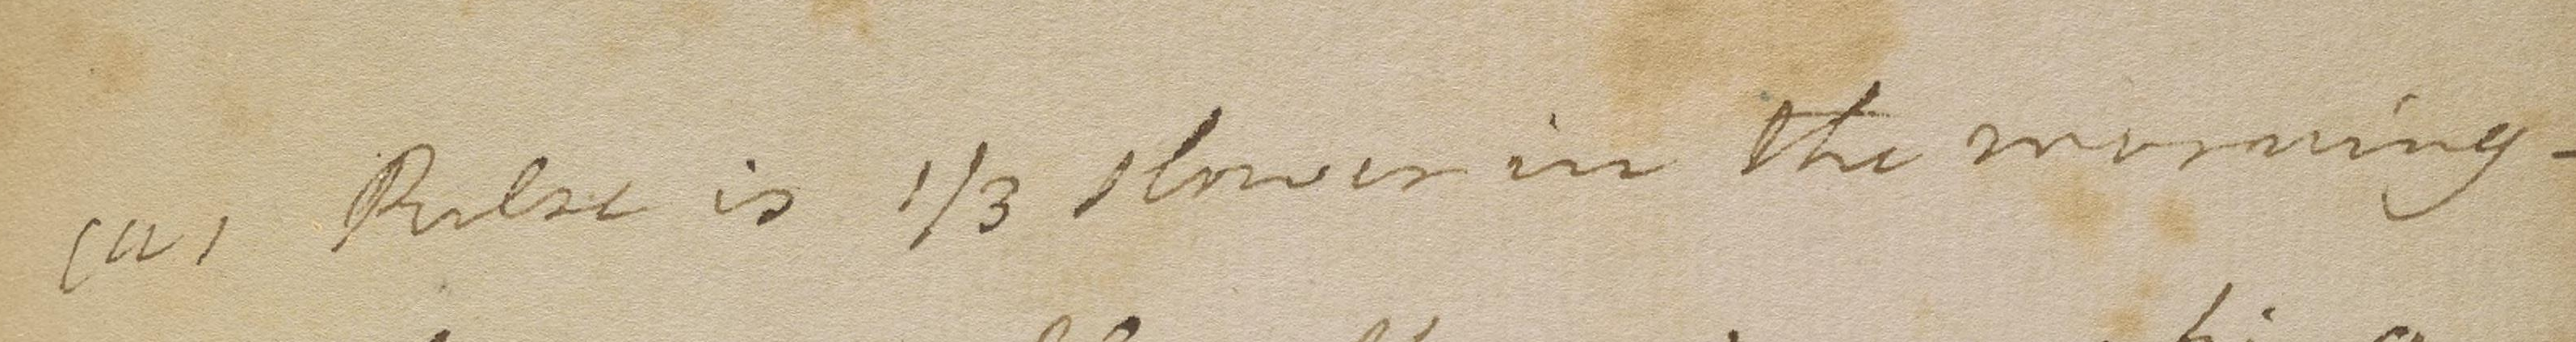(12) Pulse is 1/3 slower in the morning,
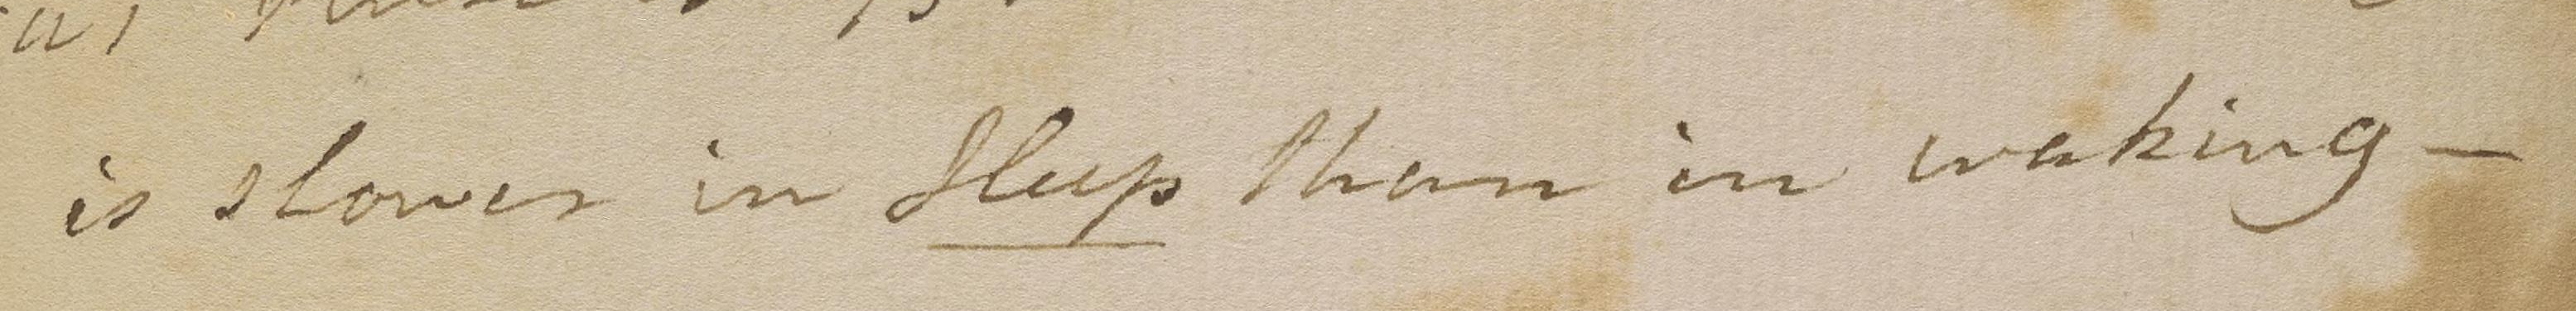is slower in sleep than in waking
